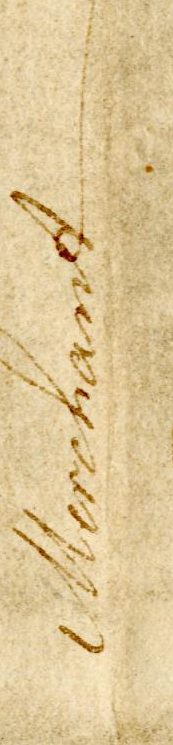Merchant
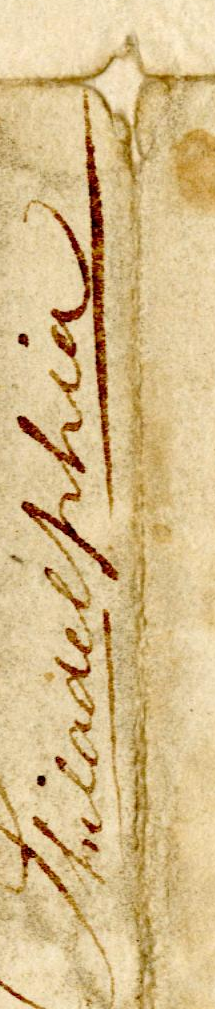Philadelphia
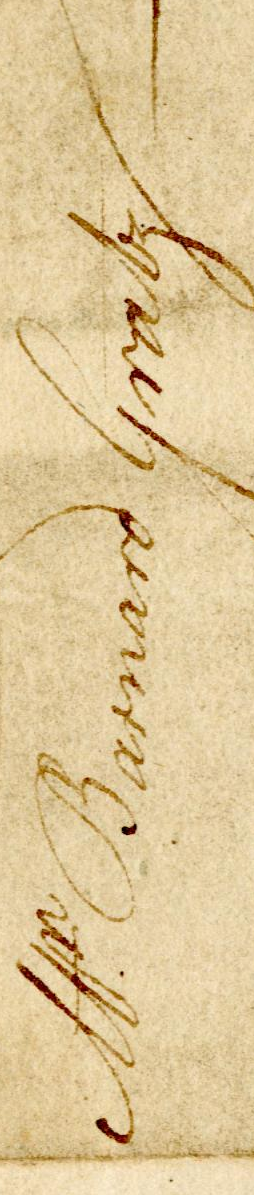M^r Barnard Gratz
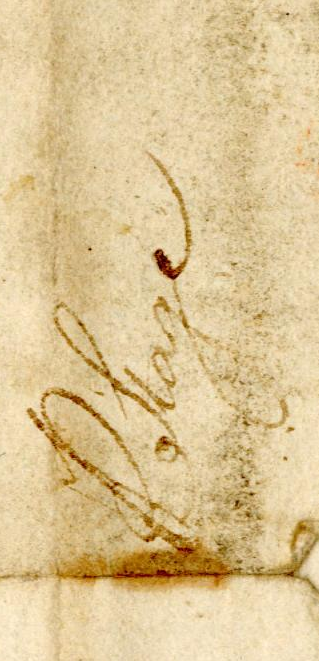P Stage
